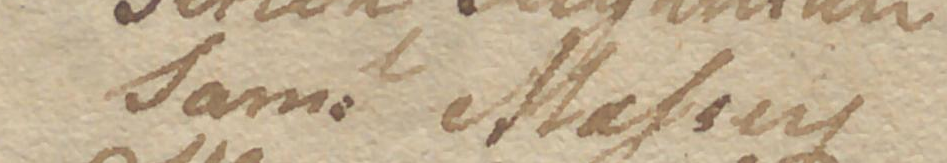Sam^l. Massey
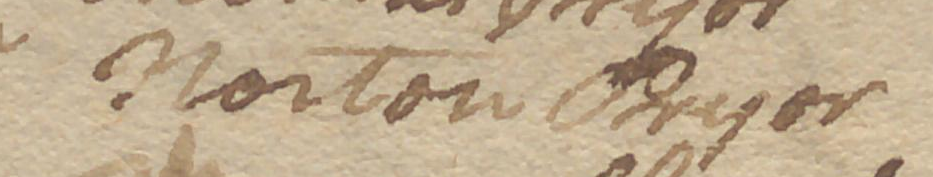Norton Pryor
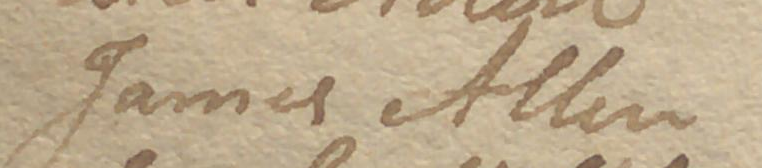James Allen
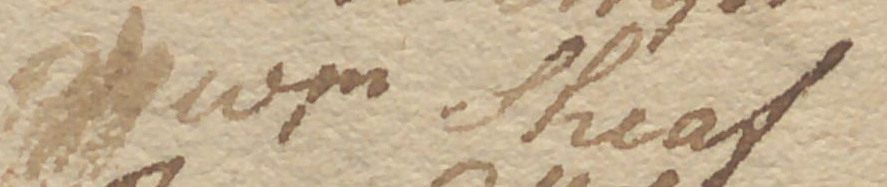wm. Sheaf
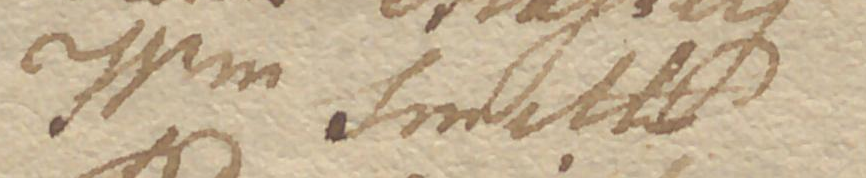W^m. Smith
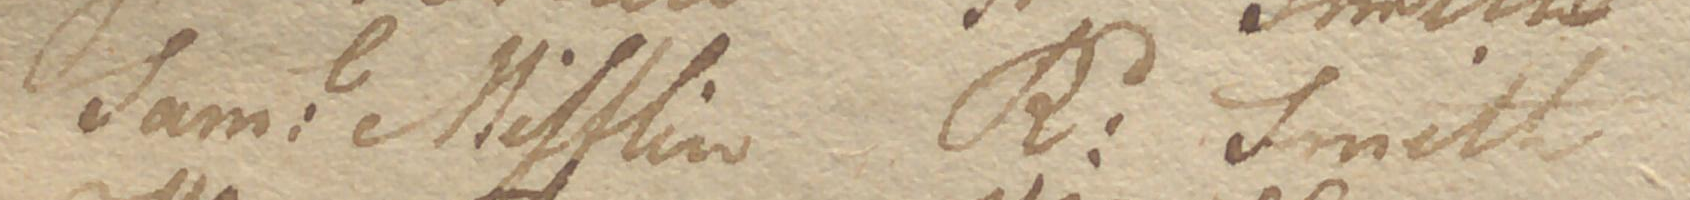Sam^l: Mifflin R^d: Smith
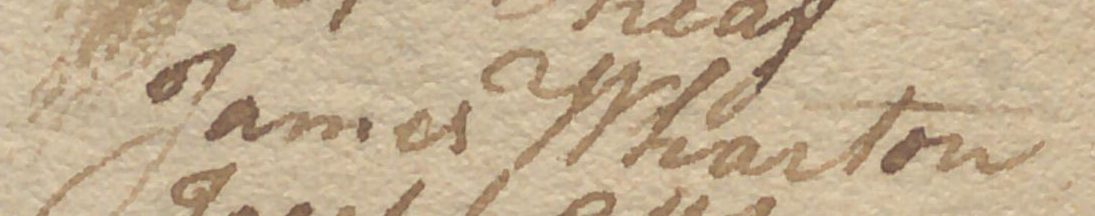James Wharton
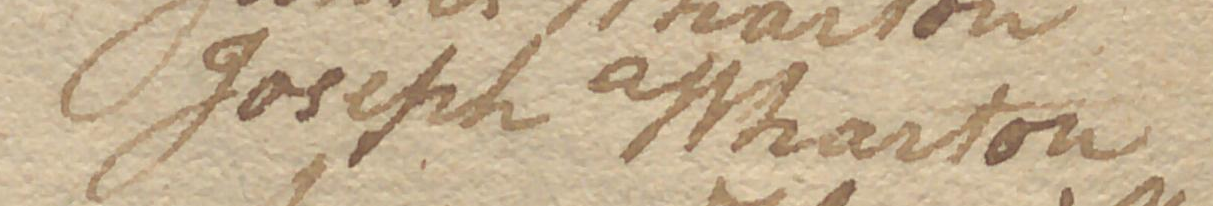Joseph Wharton
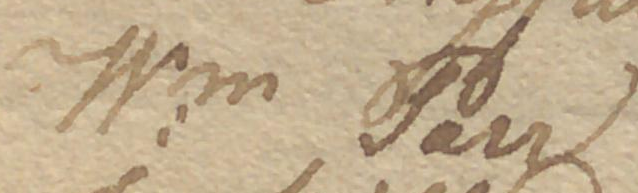W^m. Pan
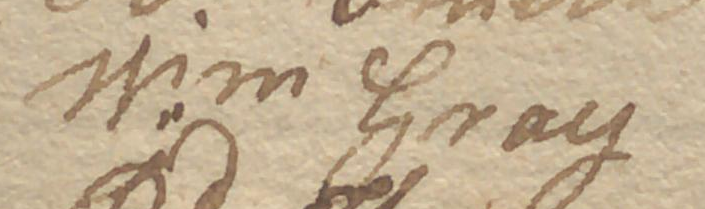W^m. Gray
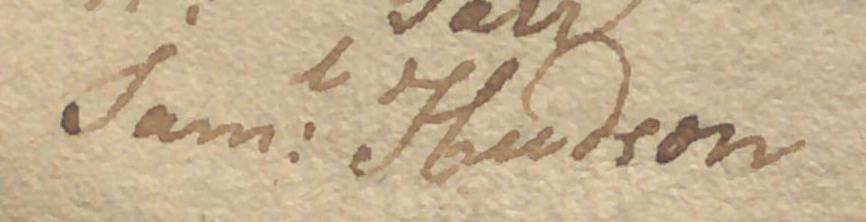Sam^l: Hudson
